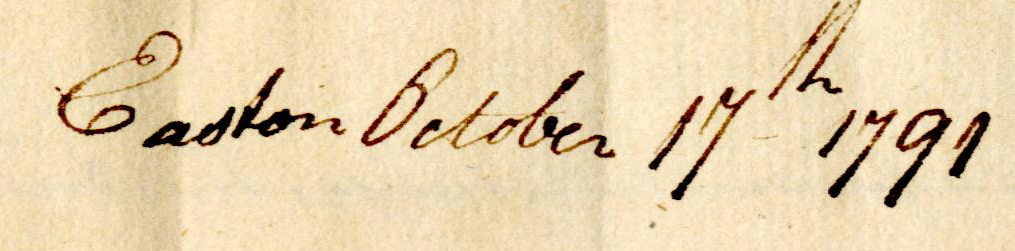Easton October 17^th 1791
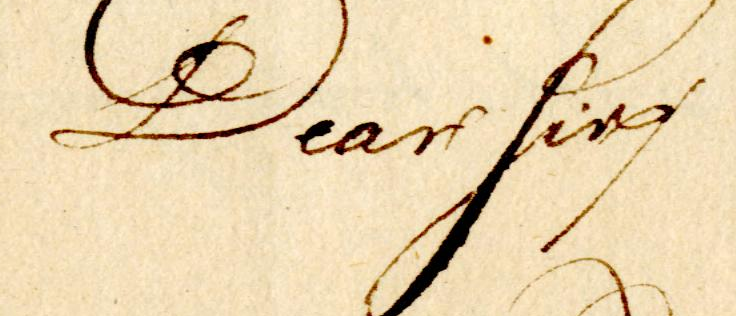Dear Sir
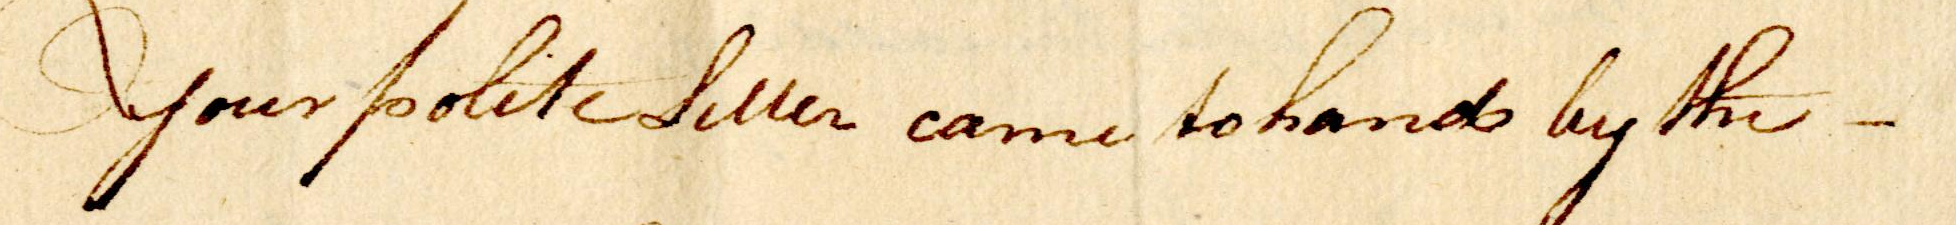Your polite letter came to hand by the-
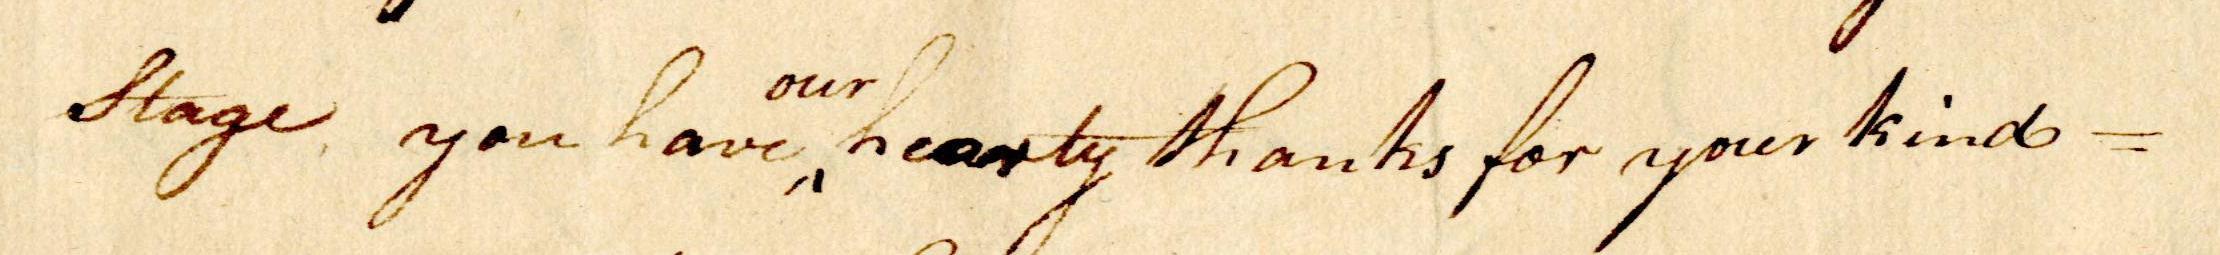Stage you have ^ hearty thanks for your kind-
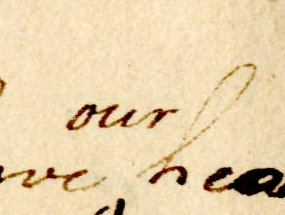our
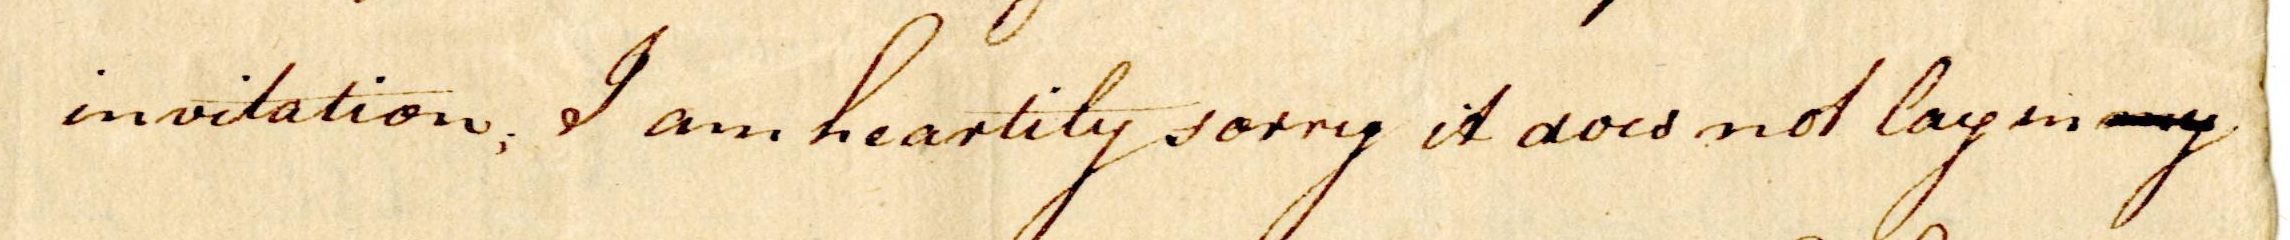invitation, I am heartily sorry it does not lay in my
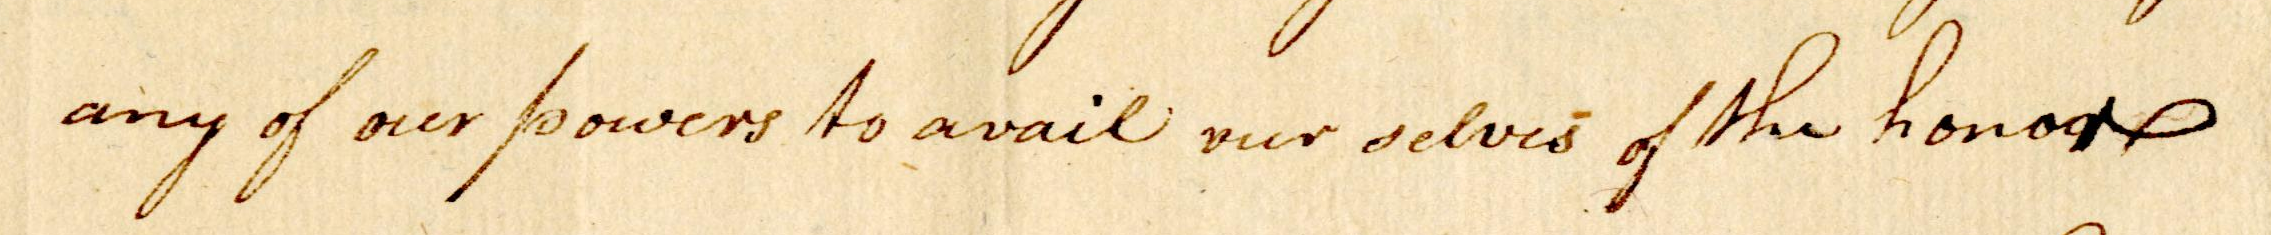any of our powers to avail our selves of the honor
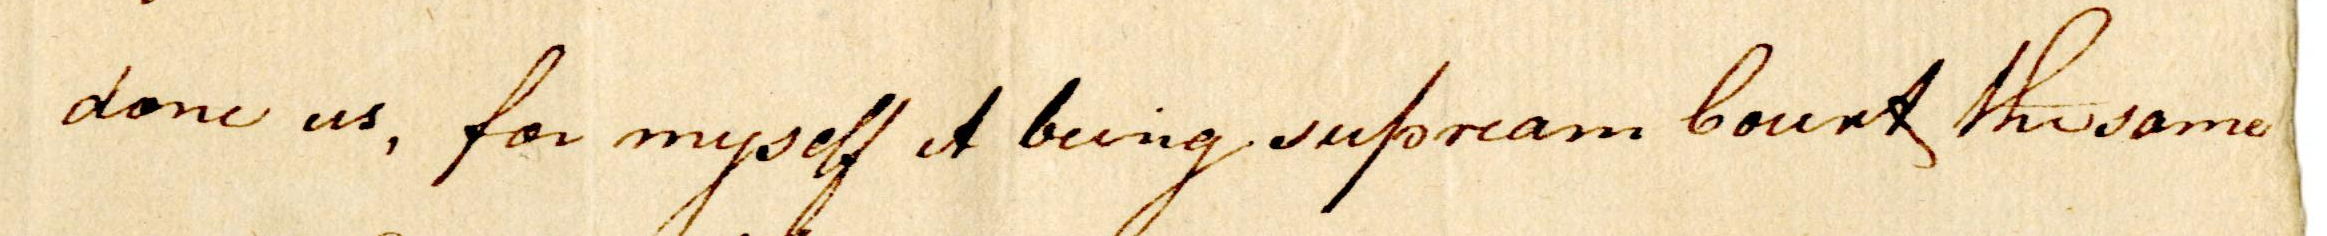done us, for myself it being supream Court the same
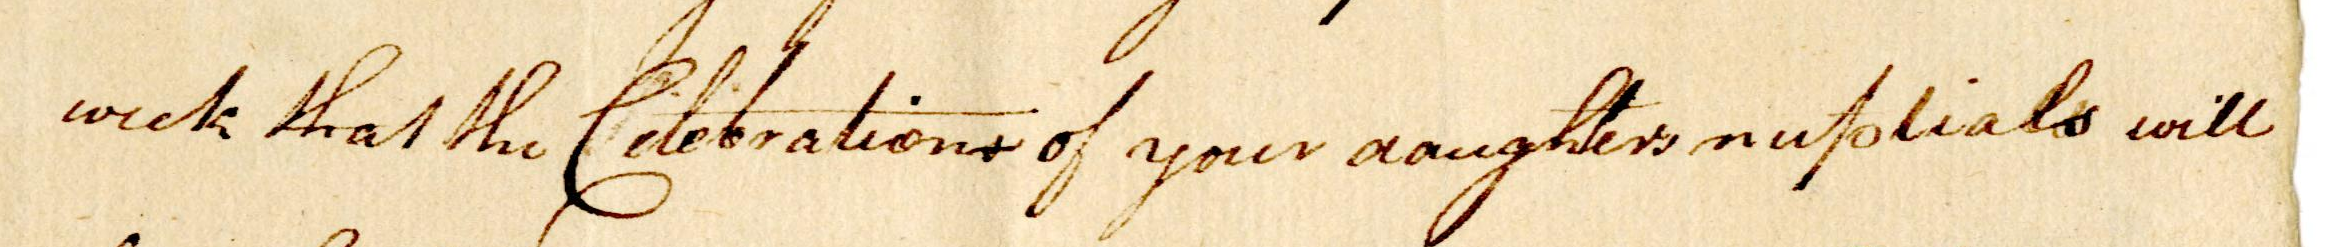week that the Celebrations of your daughters nuptials will
